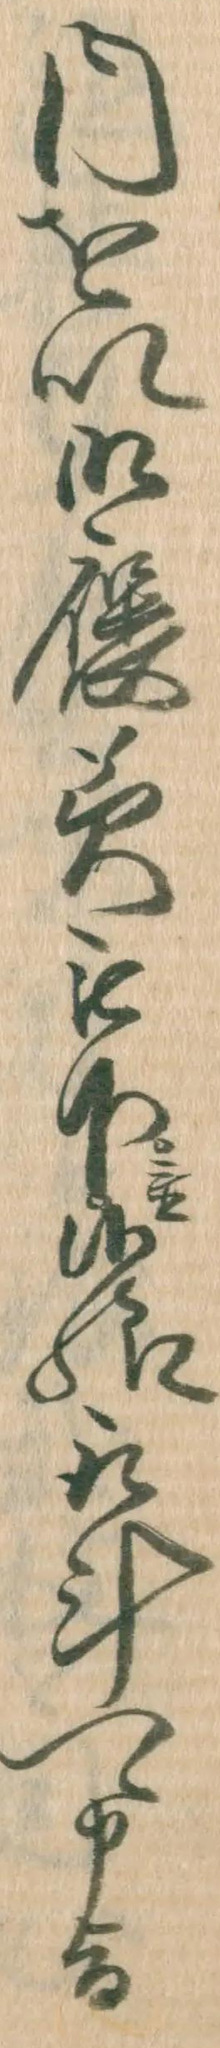内を以御褒美被下置候様取計可申旨
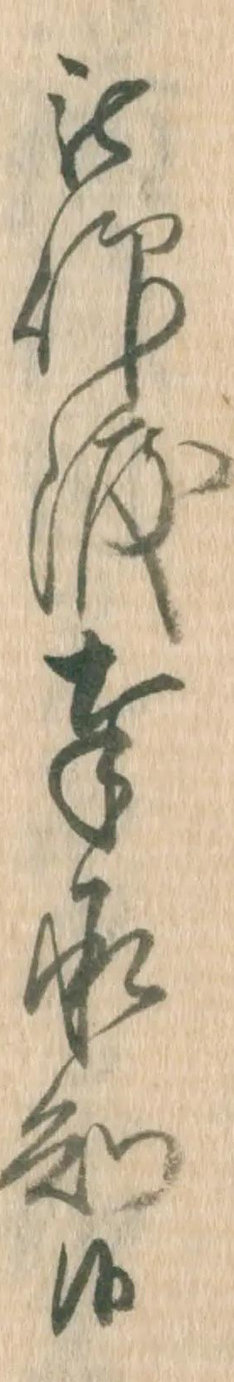被仰渡奉承知候
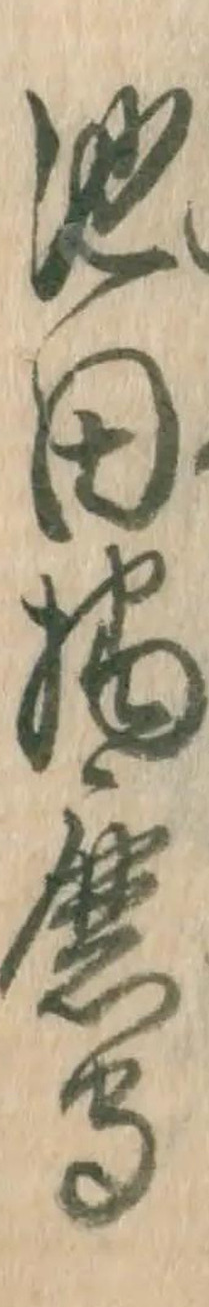池田播磨守

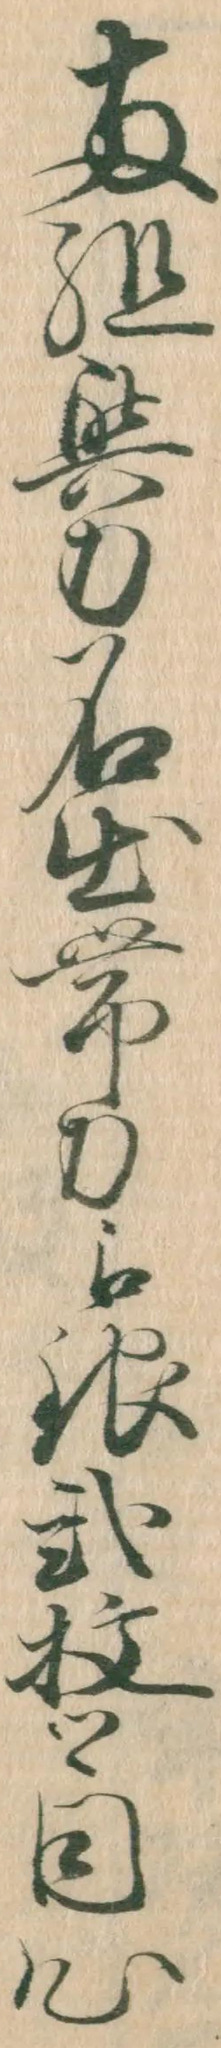両組与力石出帯刀え銀弐枚ツヽ同心
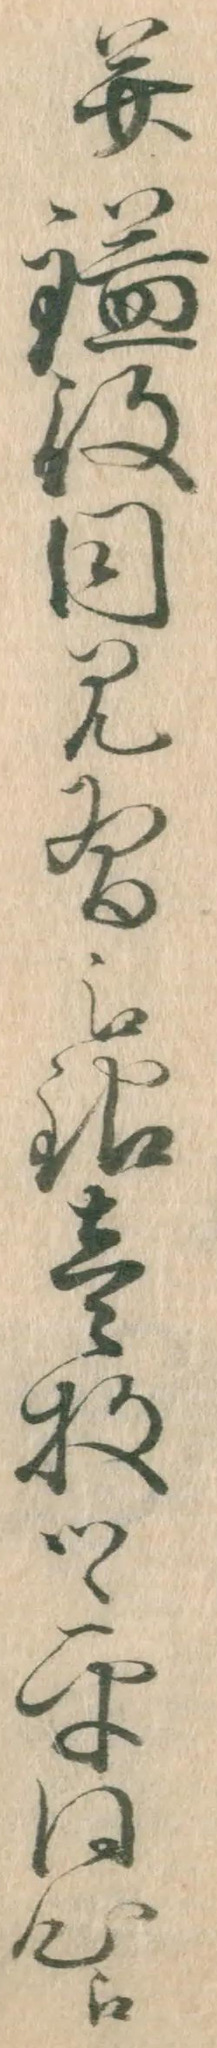幷鎰役同見習え銀壱枚ツヽ平同心え
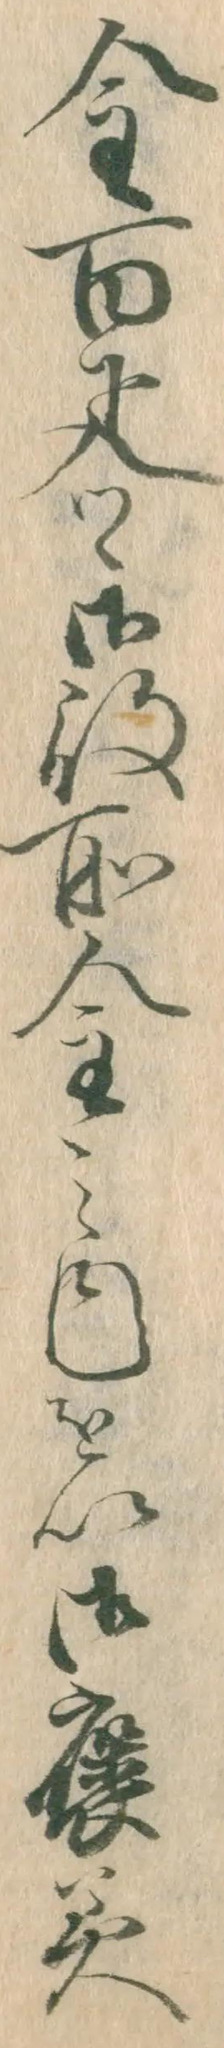金百疋ツヽ御役所金之内を以御褒美

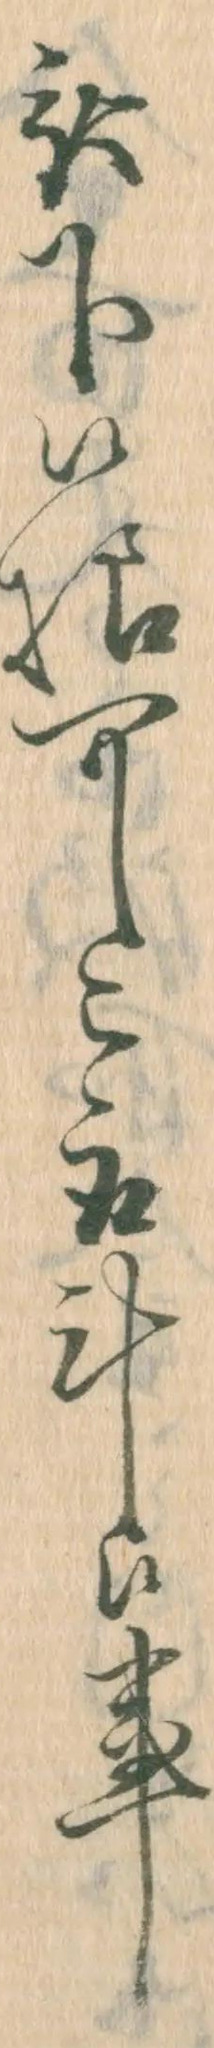被下候様可被取計候事
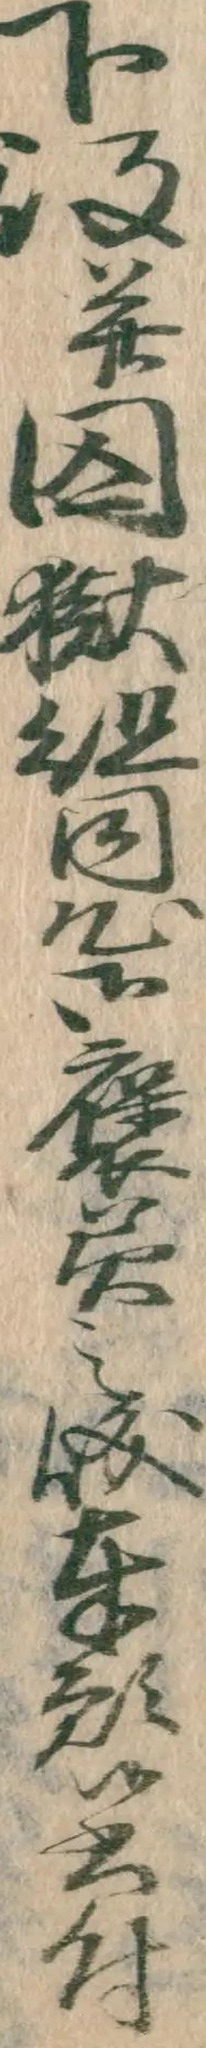│下役幷囚獄組同心御褒美之儀奉願候書付
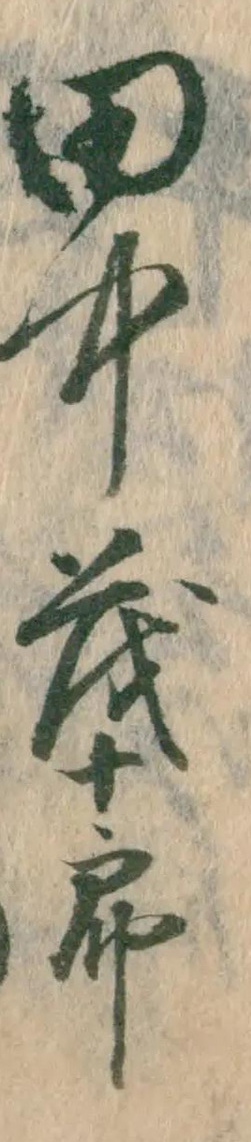田中茂十郎
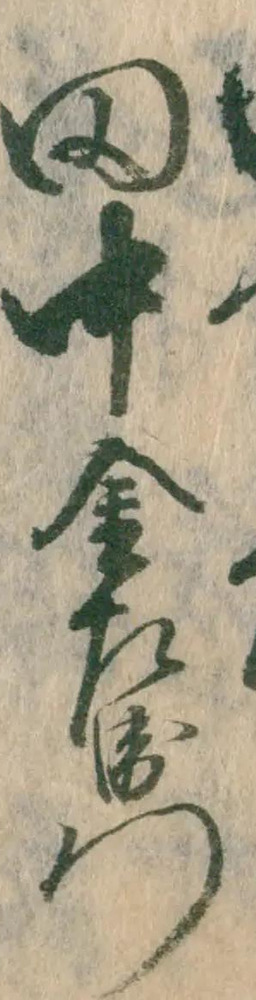田中金左衛門

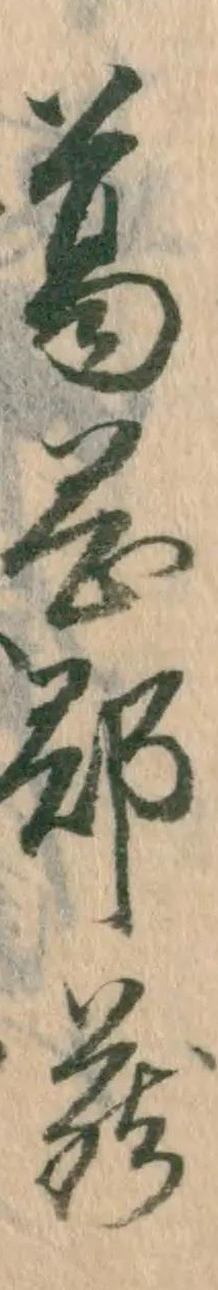葛岡郡蔵
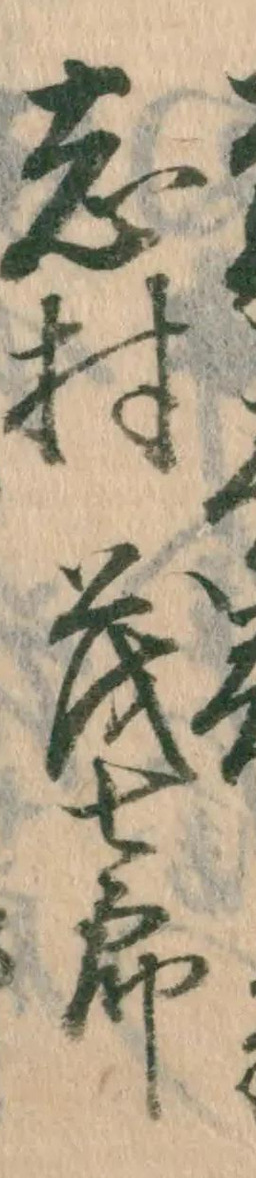志村茂七郎
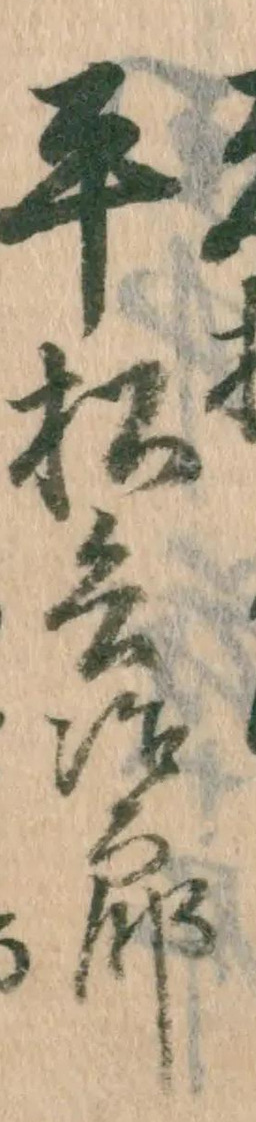平松兵治郎
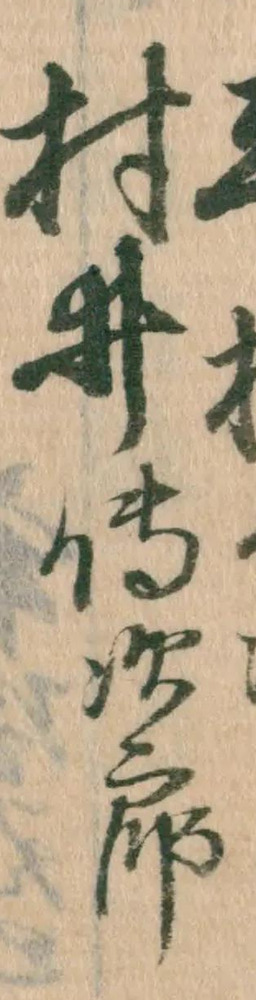村井伝次郎
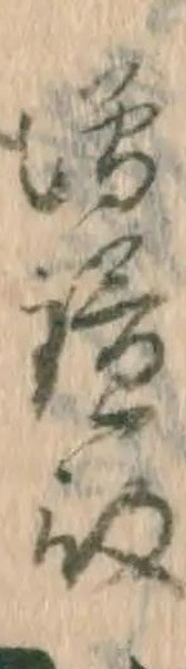増鎰役
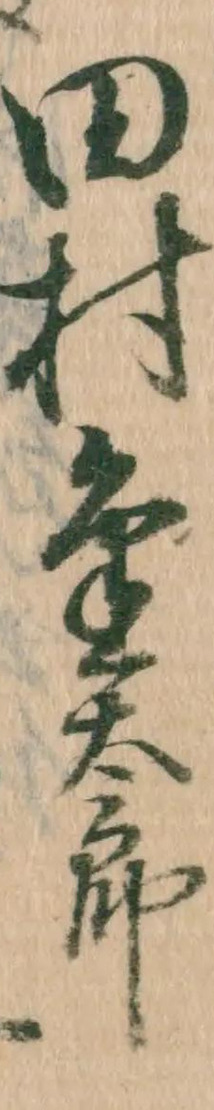田村金太郎
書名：七十冊物類集 71巻. [44] 四十三 牢屋敷御普請御修覆地震ニ付骨折候牢屋掛御褒美之部
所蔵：国立国会図書館 National Diet Library, JAPAN
